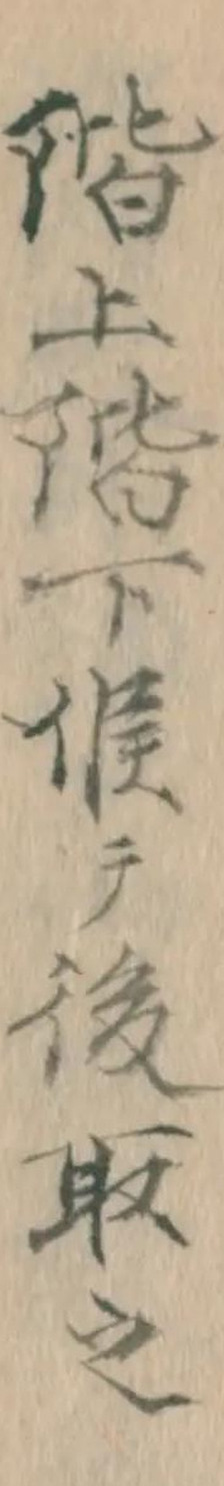階上階下候テ後取之
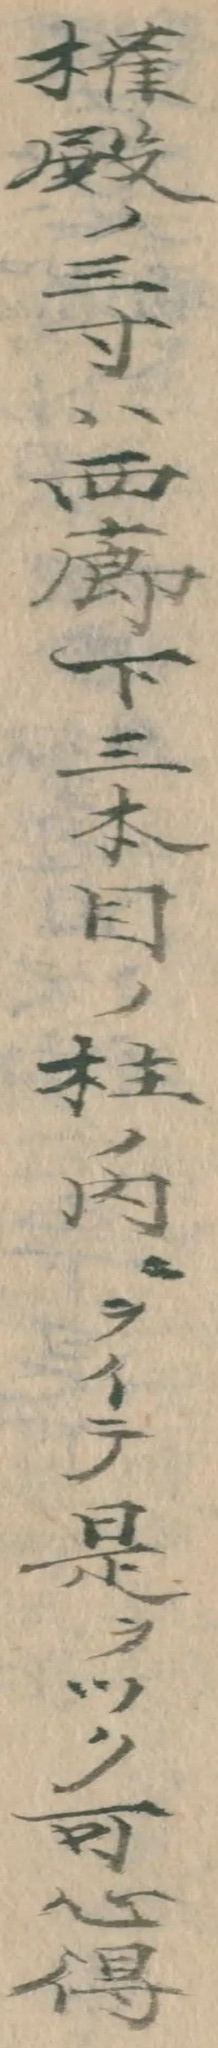権殿ノ三寸ハ西廊下三本目ノ柱ノ内ニヲイテ是ヲツク可心得
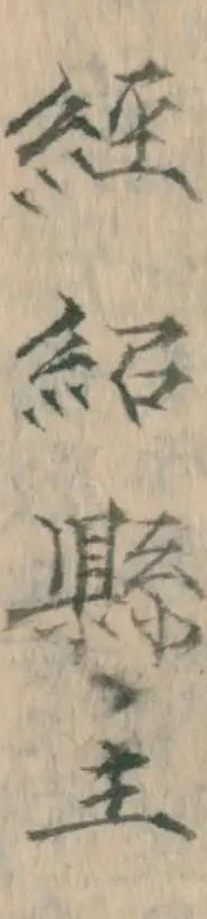経紹県主
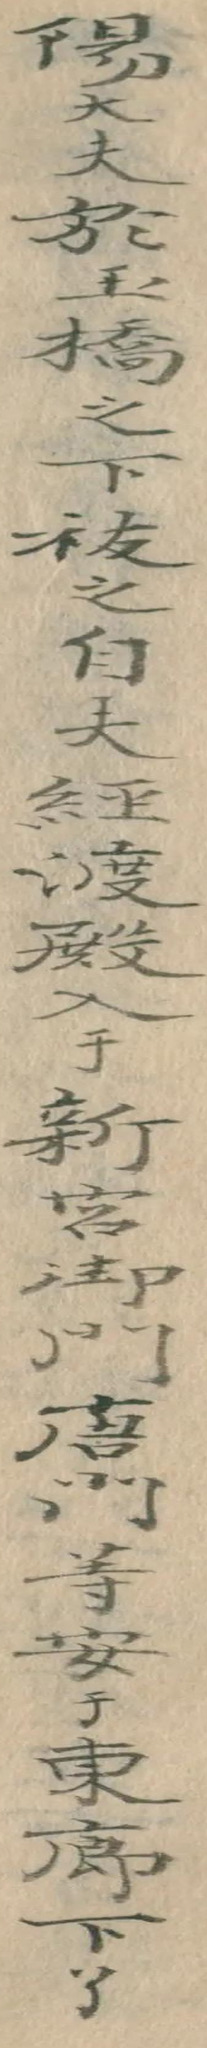陽大夫於玉橋之下祓之自夫経渡殿入于新宮御門唐門等安于東廊下了

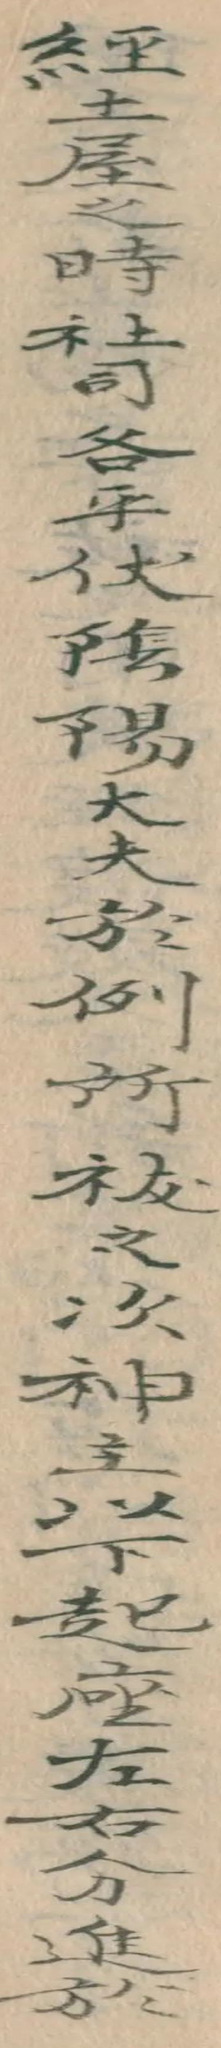経土屋之時社司各平伏陰陽大夫於例所祓之次神主以下起座左右分進於
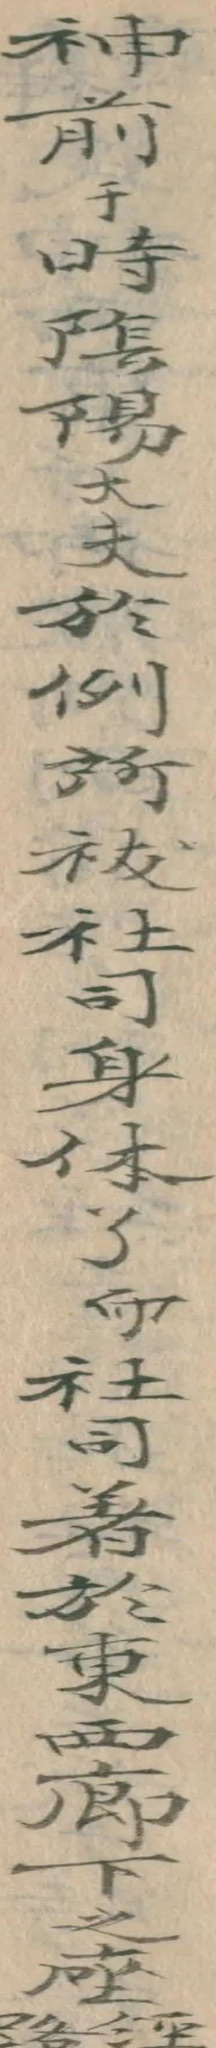神前于時陰陽大夫於例所祓社司身体了而社司着於東西廊下之座経路
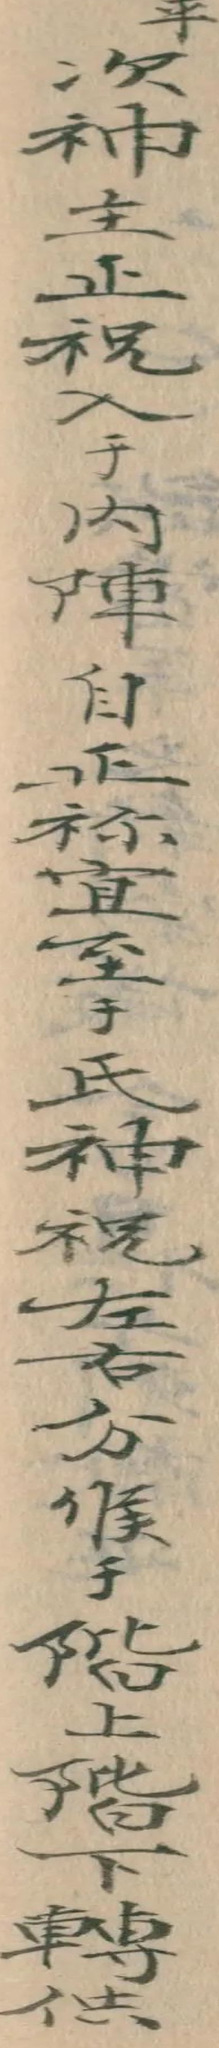座平伏次神主正祝入于内陣自正祢宜至于氏神祝左右分候于階上階下転供
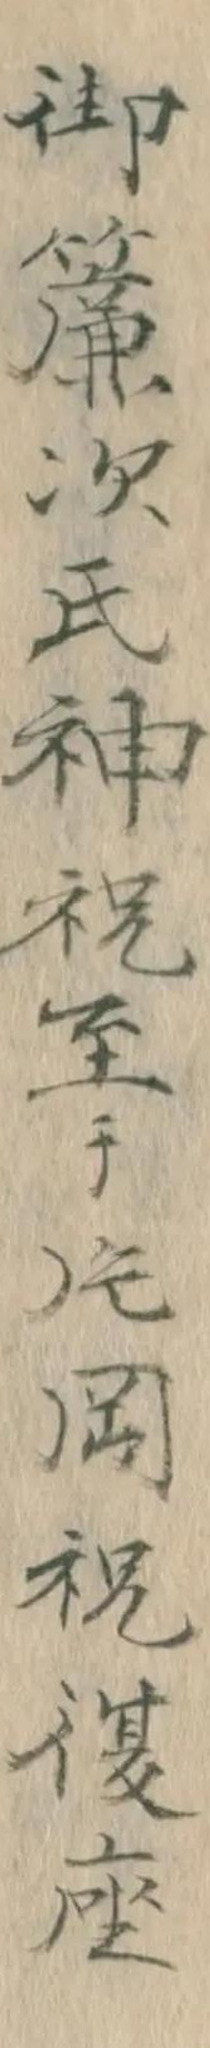御簾次氏神祝至于片岡祝復座

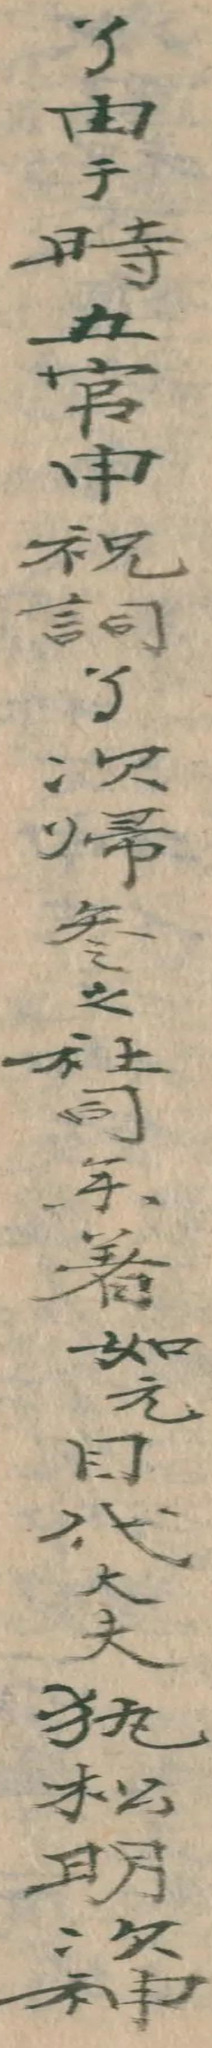了由于時五官申祝詞了次帰参之社司参着如元目代大夫執松明次神
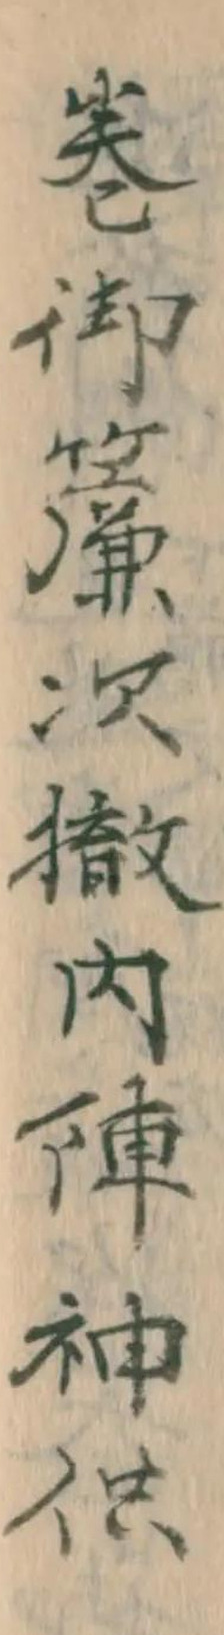巻御簾次撤内陣神供
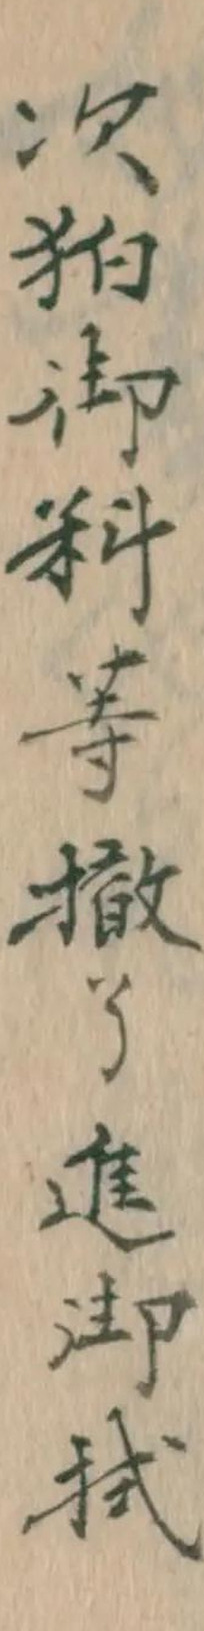次狛御料等撤了進御拭

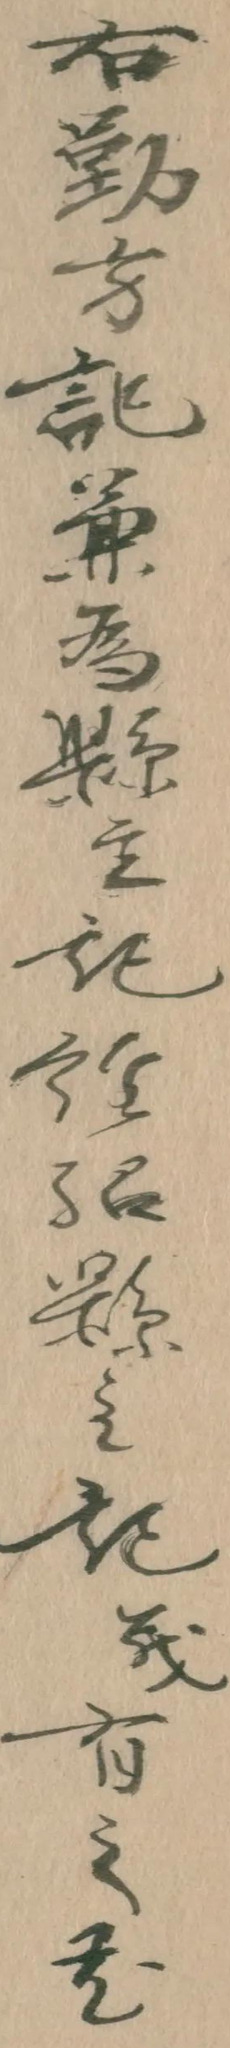右勤方記兼為県主記経紹県主記茂有之尤
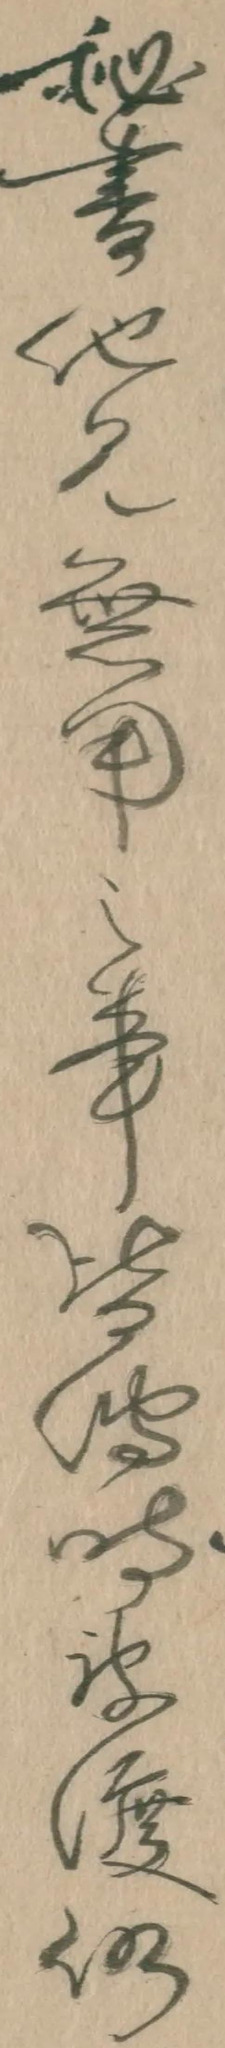秘書他見無用之事皆伝時被渡仍
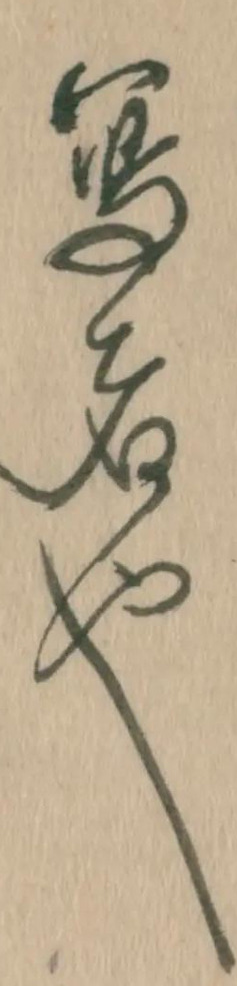写者也
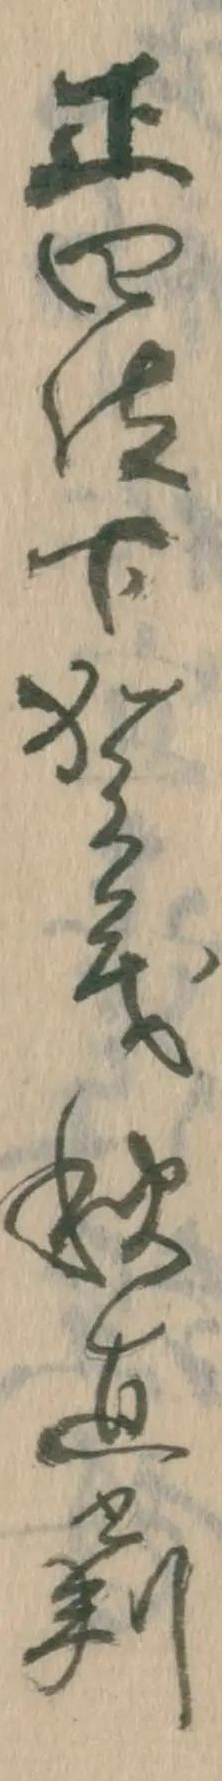正四位下賀茂秋直書判

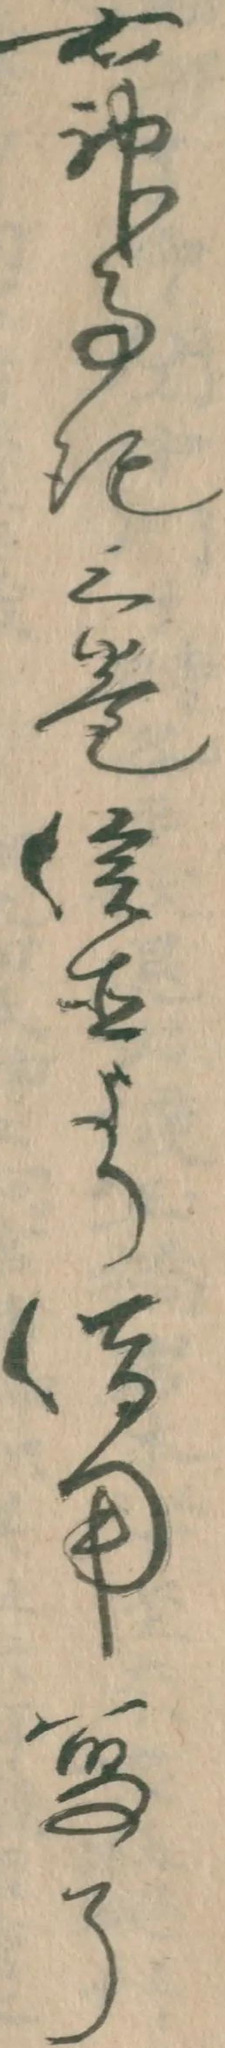右神事記三巻信直より借用写了
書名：賀茂社記録. 第9冊
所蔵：国立国会図書館 National Diet Library, JAPAN
